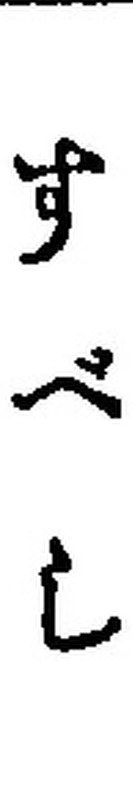すべし
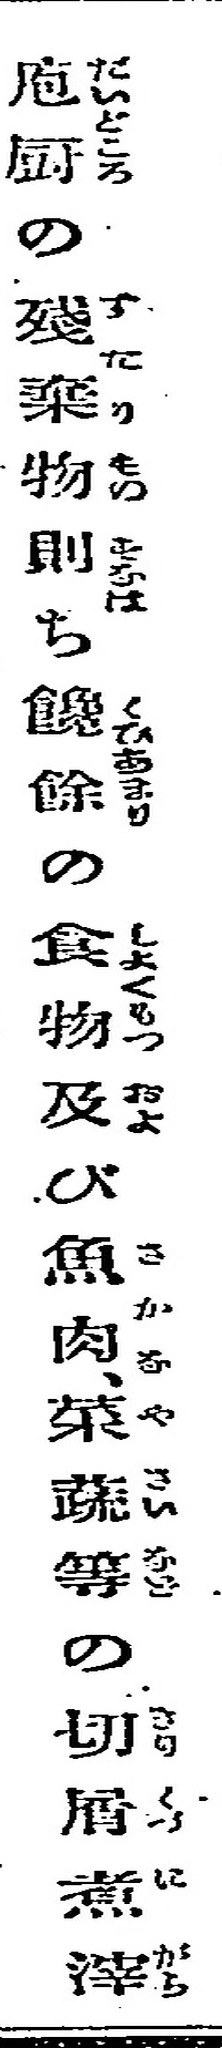庖厨の残棄物則ち饞餘の食物及び魚肉、菜菰等の切屑煮滓
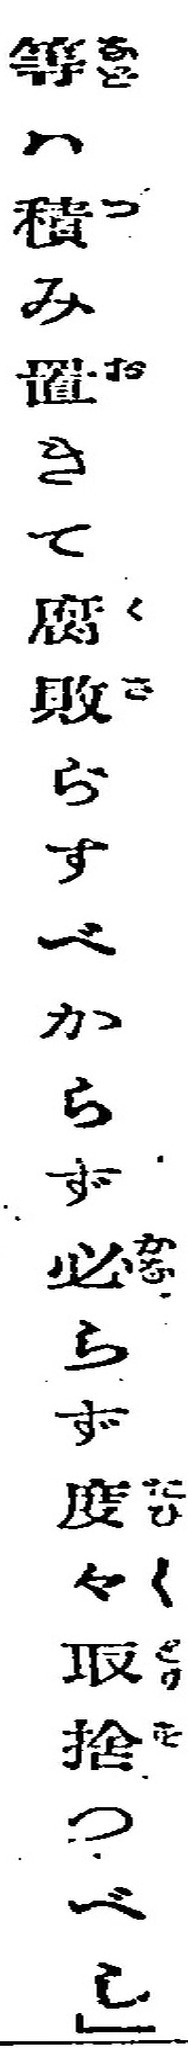等は積み置きて腐敗らすべからず必らず度々取捨つべし」
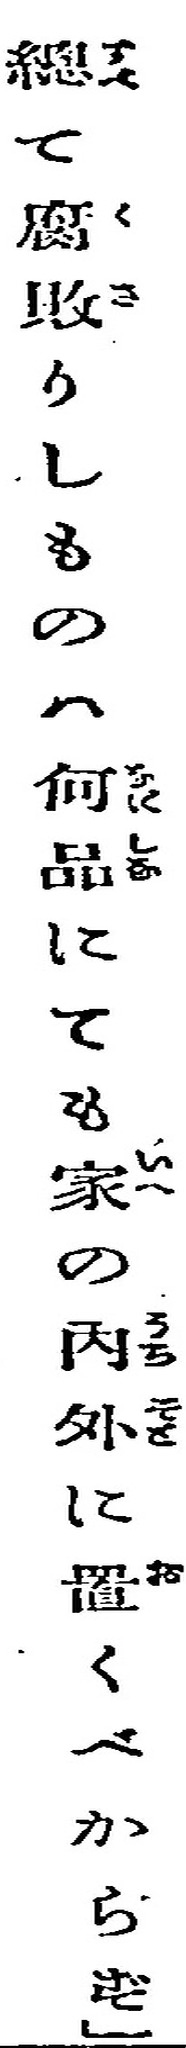総て腐敗りしものは何品にても家の内外に置くべからず」
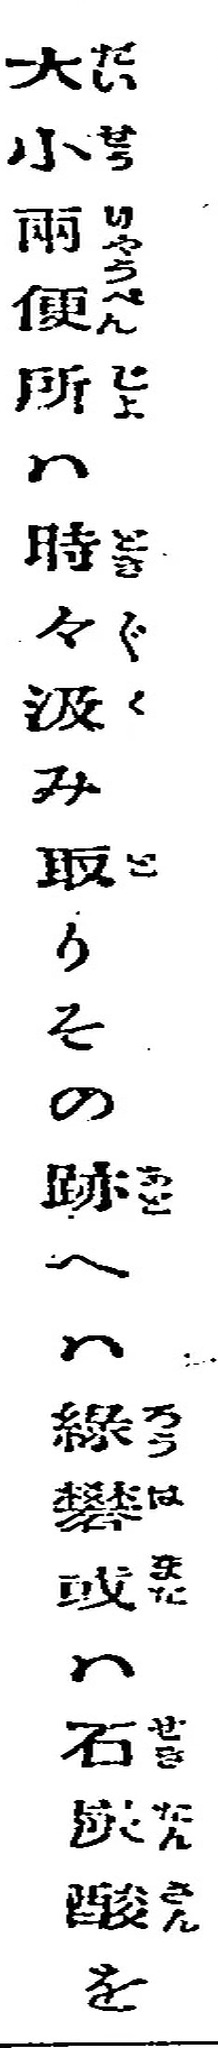大小両便所は時々汲み取りその跡へは緑礬或は石炭酸を
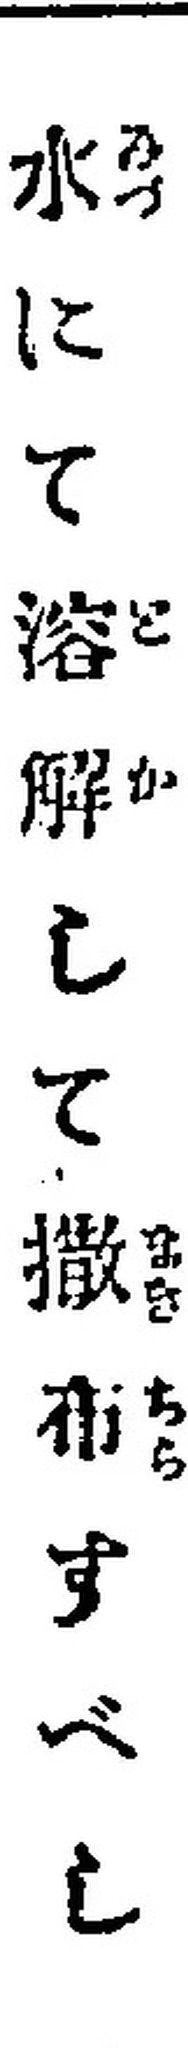水にて溶解して撒布すべし
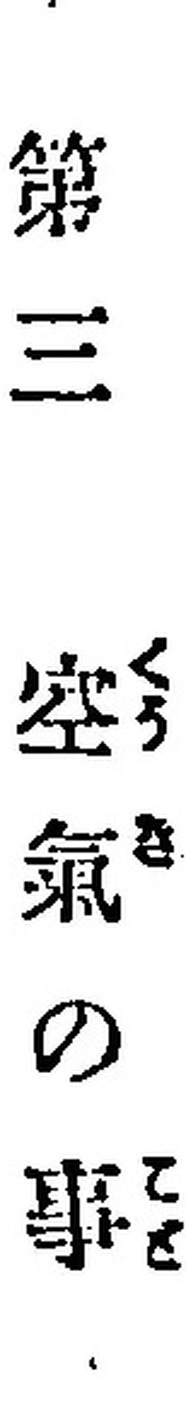第三空気の事
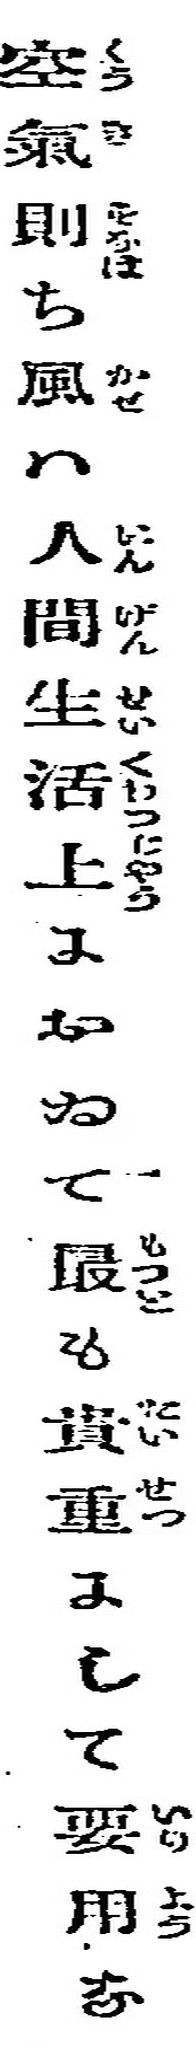空気則ち風は人間生活上におゐて最も貴重にして要用な
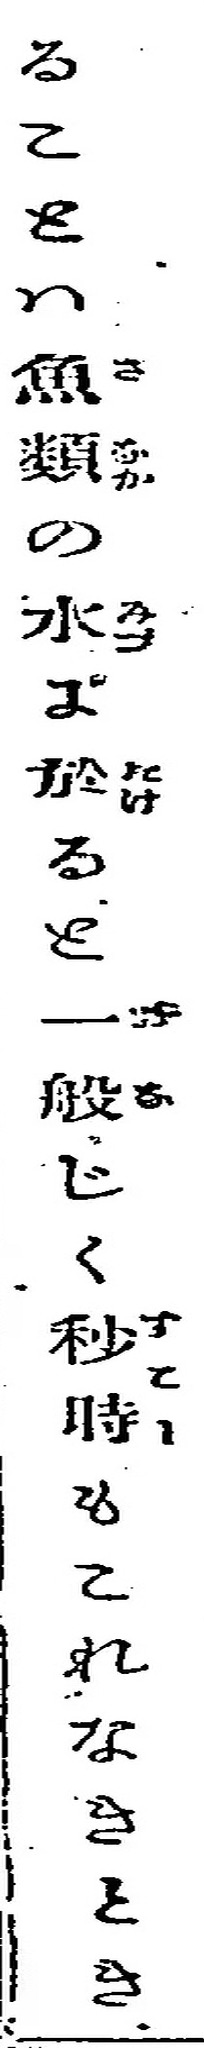ることは魚類の水に於ると一般じく秒時もこれなきとき

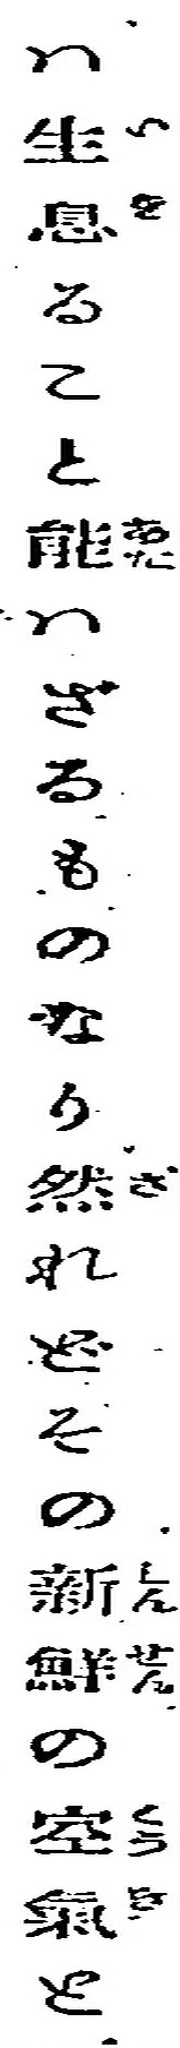は生息ること能はざえるものなり然れどその新鮮の空気と
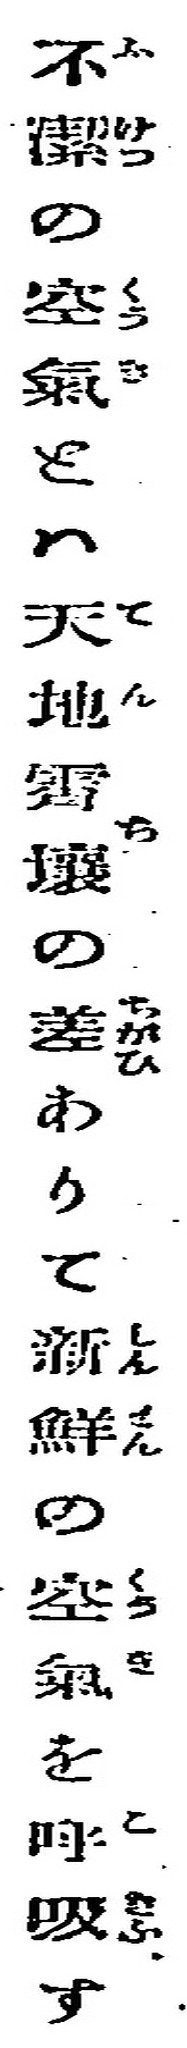不潔の空気とは天地霄壌の差ありて新鮮の空気を呼吸す
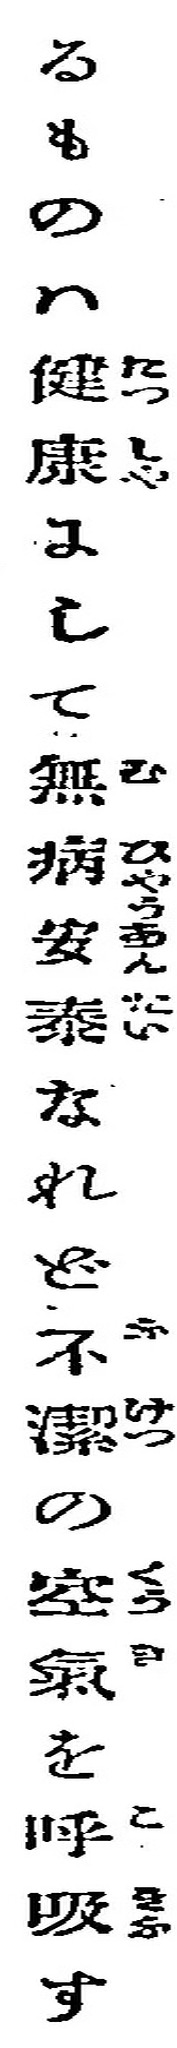るものは建康にして無病安泰なれど不潔の空気を呼吸す
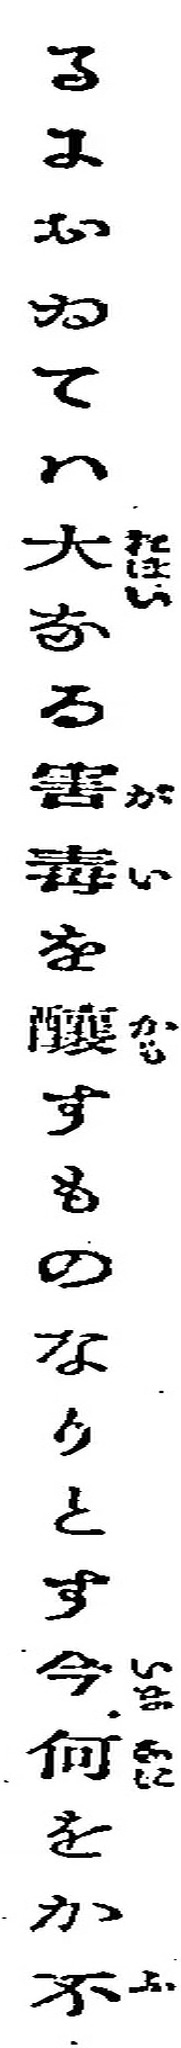るにおゐては大なる害毒を醸すものなりとす今何をか不
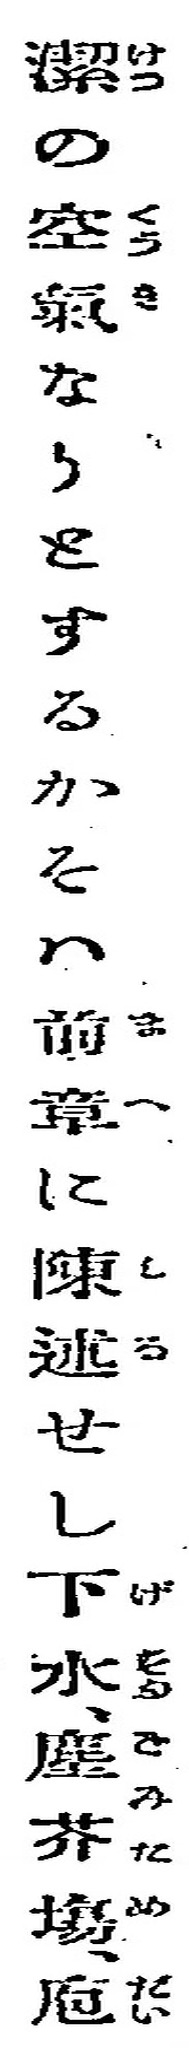潔の空気なりとするかは前章に陳述せし下水、塵芥場、庖
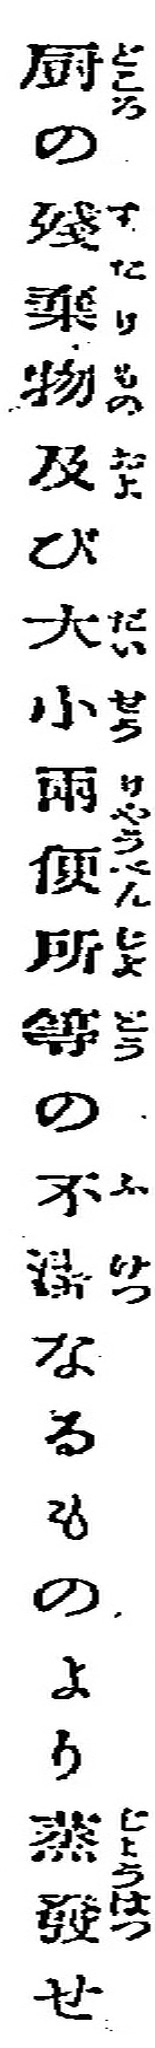厨の残棄及び大小両便所等の不潔なるものより蒸発せ
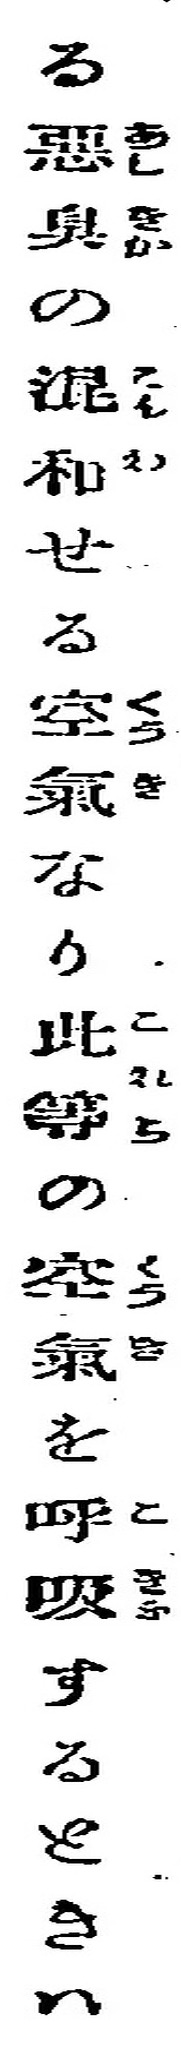る悪臭の混和せる空気なり此等の空気を呼吸するときは
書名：新撰暑中養生法 : 附・コレラ予防歌
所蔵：国立国会図書館 National Diet Library, JAPAN
